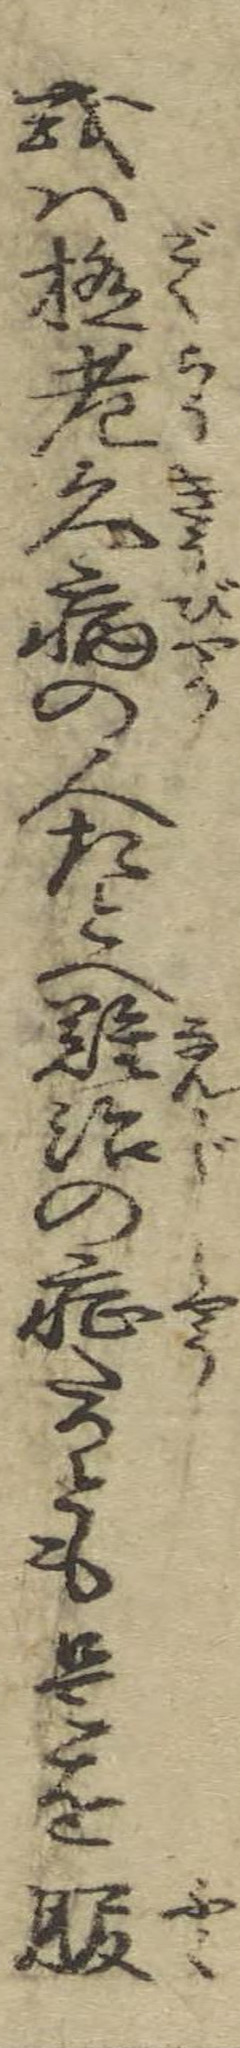或は極老久病の人たとへ難治の症たりとも是を服
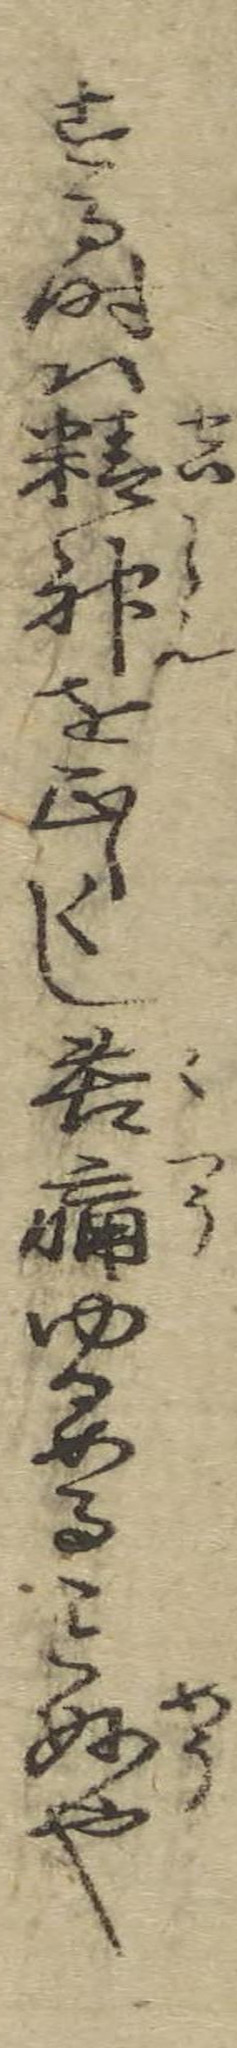する時は精神を正しくし苦痛ゆるめること妙也
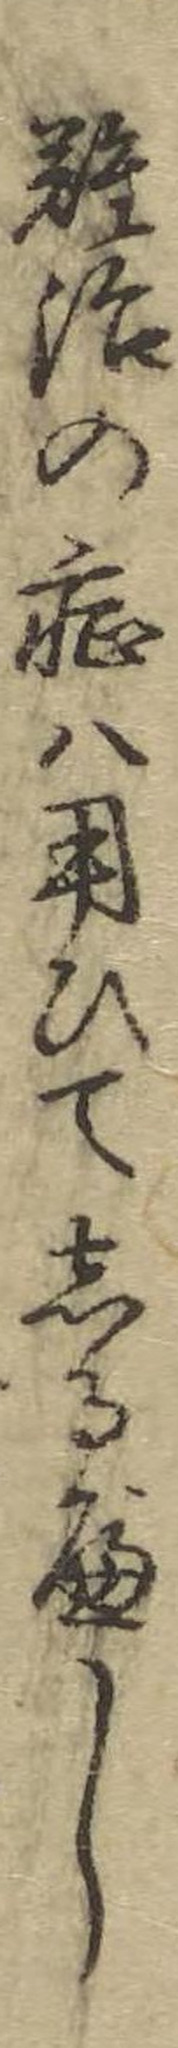難治の症は用ひてしるべし
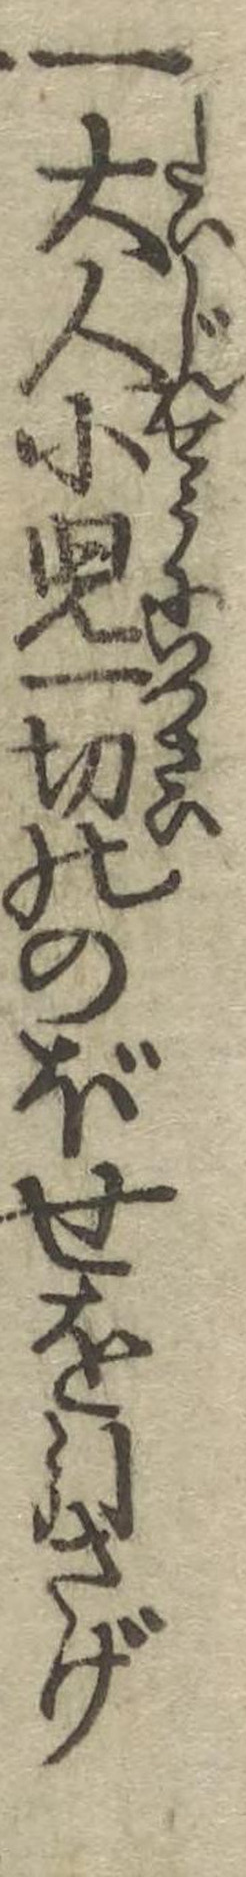一大人小児一切ののぼせを引さげ
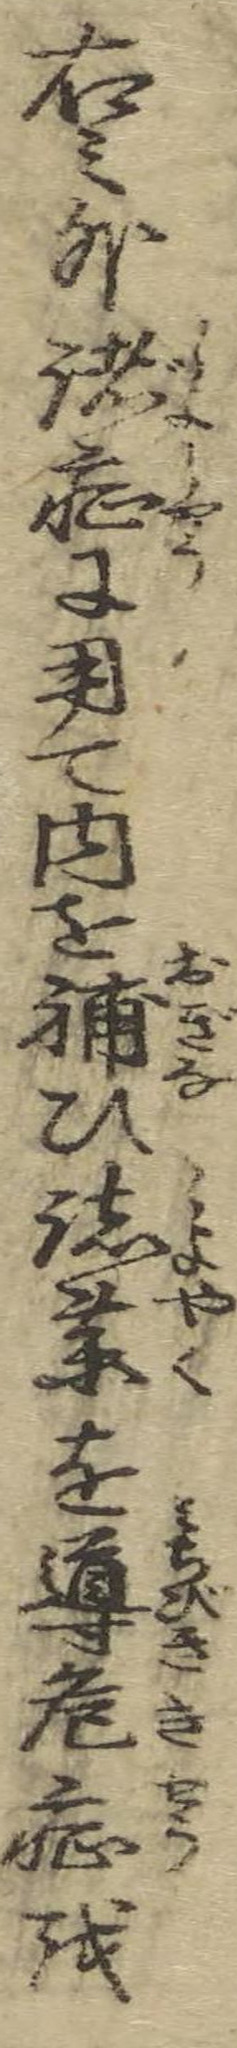右の外諸症に用て内を補ひ諸薬を導危症を
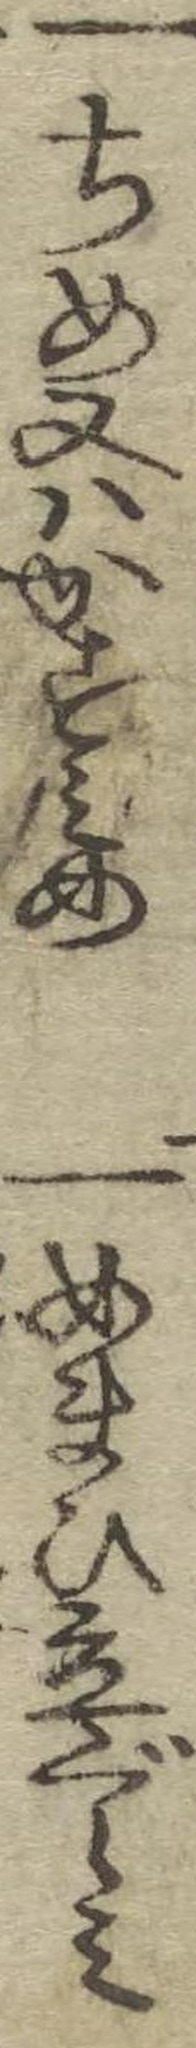一ちめ又はかすみめ一めまひ立ぐらみ
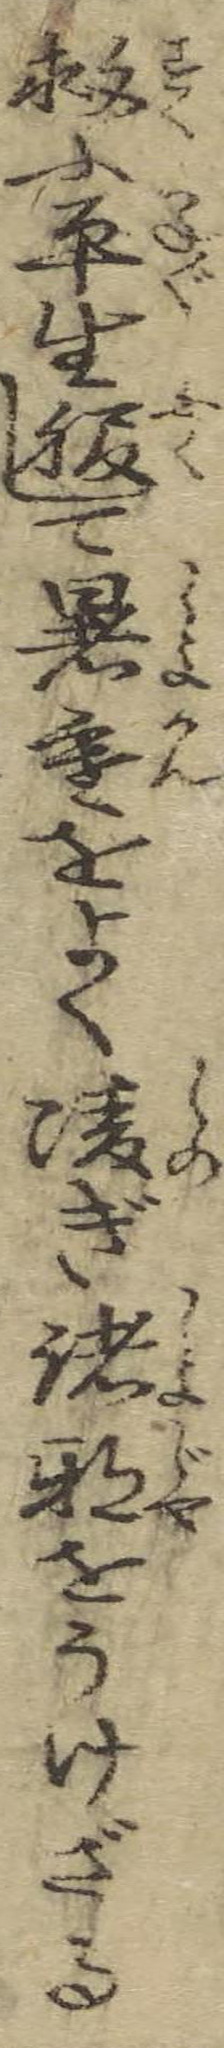救ふ平生服して暑寒をよく凌ぎ諸邪をうけざる
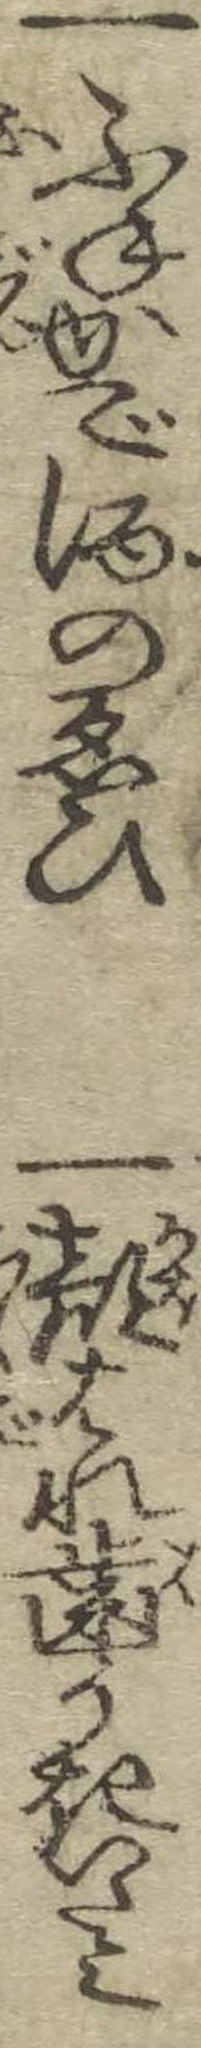一ふねかご酒のゑひ一顔はれ歯うきいたみ
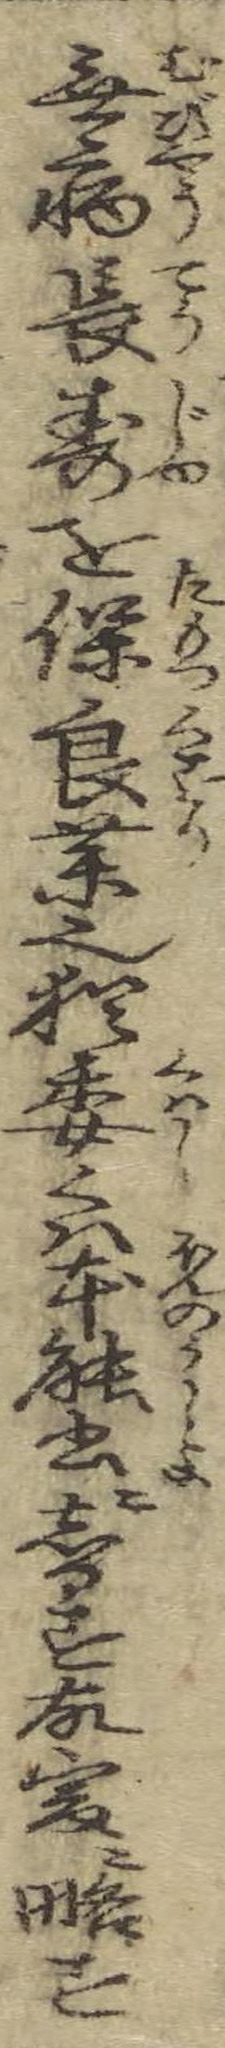無病長寿を保良薬也猶委くは本能書にしるす故爰に略す
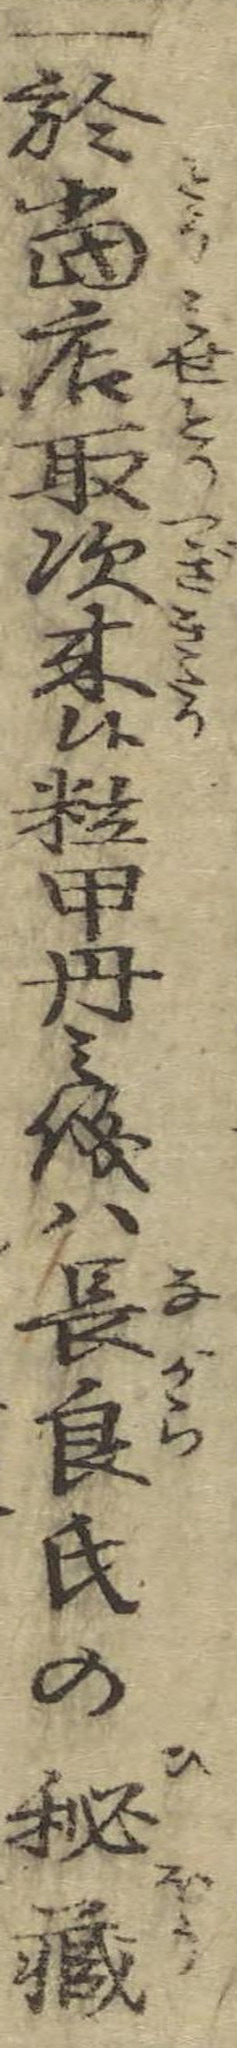一於当店取次来候粒甲丹之儀は長良氏の秘蔵
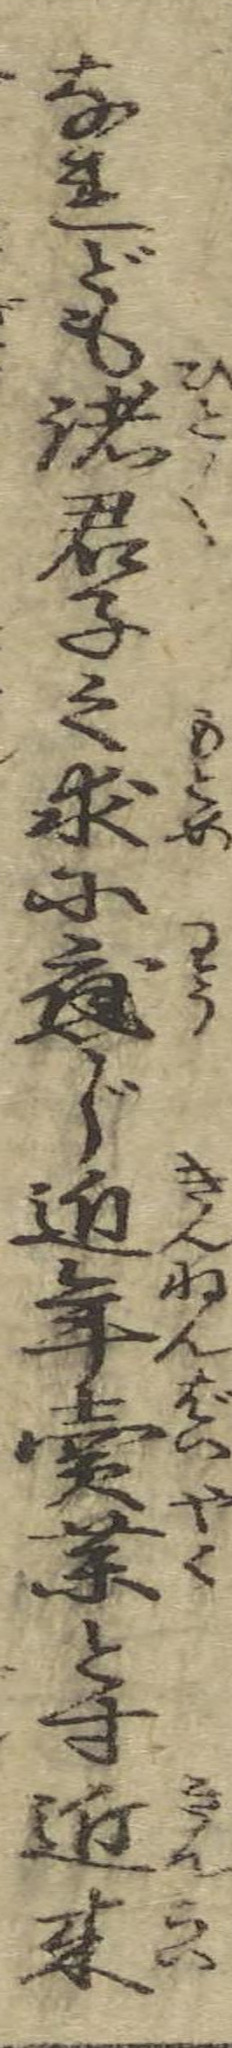なれども諸君子之求に応じ近年売薬とす近来
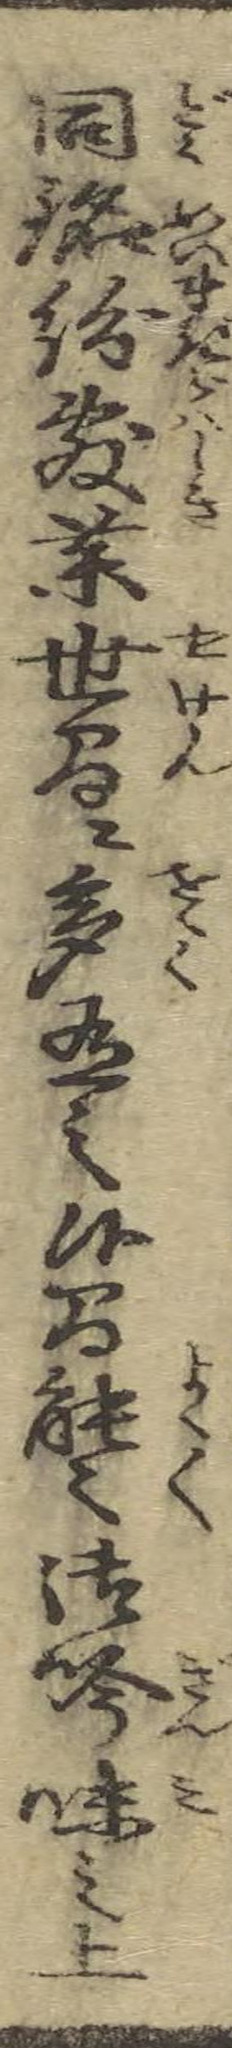同銘紛敷薬世間に多有之候間能々御吟味之上
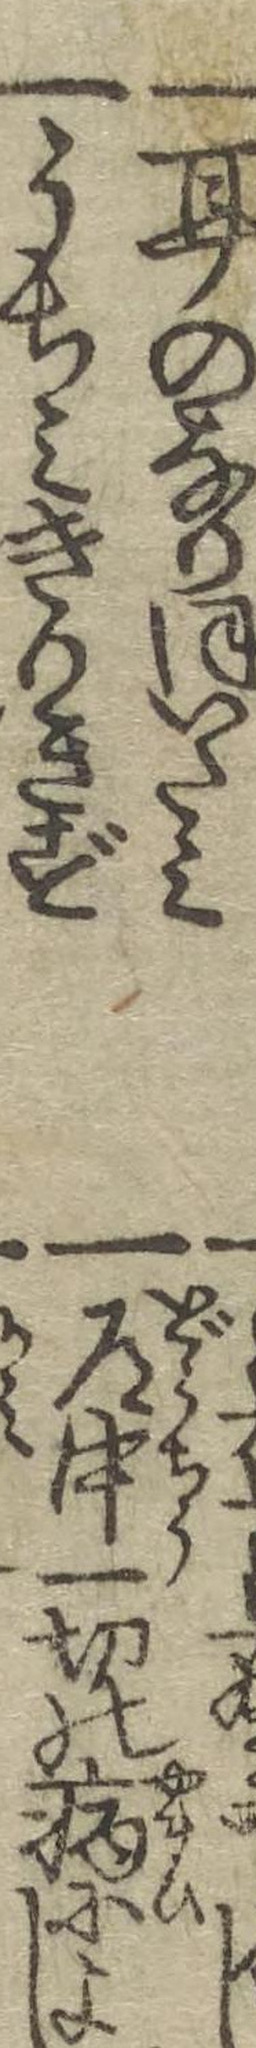一うちみきりきず一道中一切の病によし
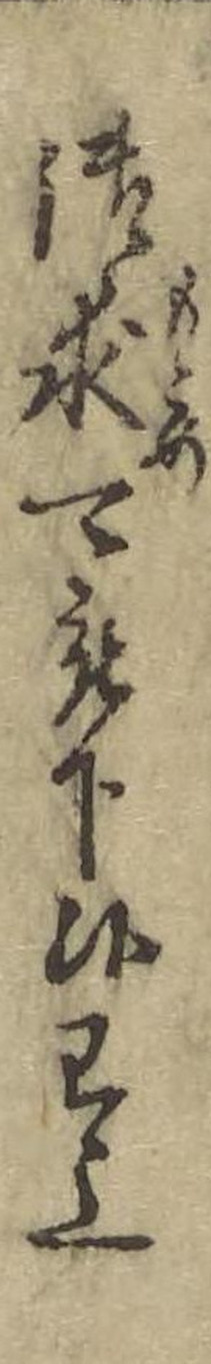御求可被下候已上
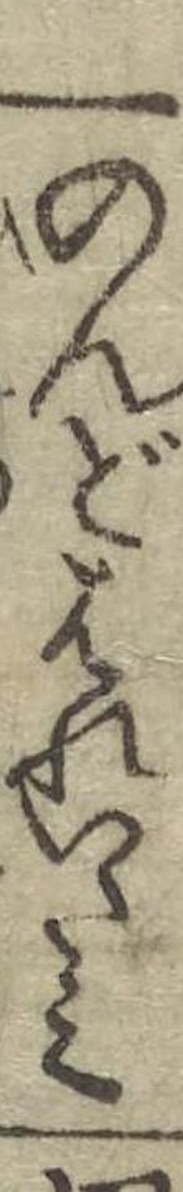一のんどはれいたみ
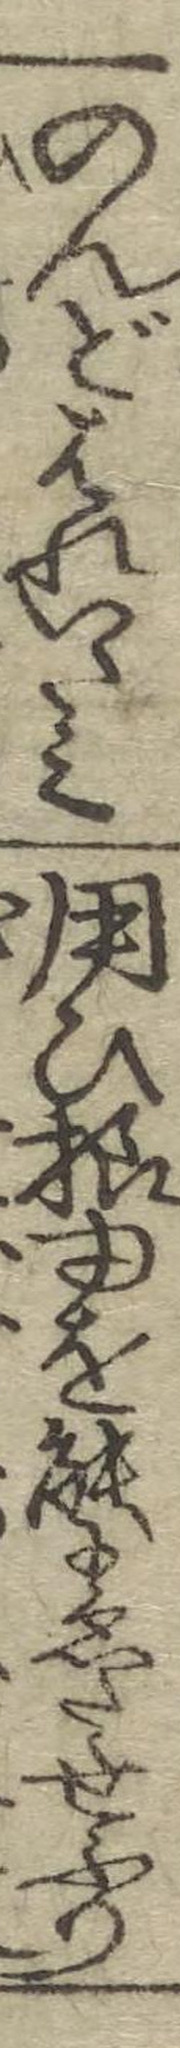一のんどはれいたみ
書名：浪華薬種問屋能書張交帖. 二
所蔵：国立国会図書館 National Diet Library, JAPAN
